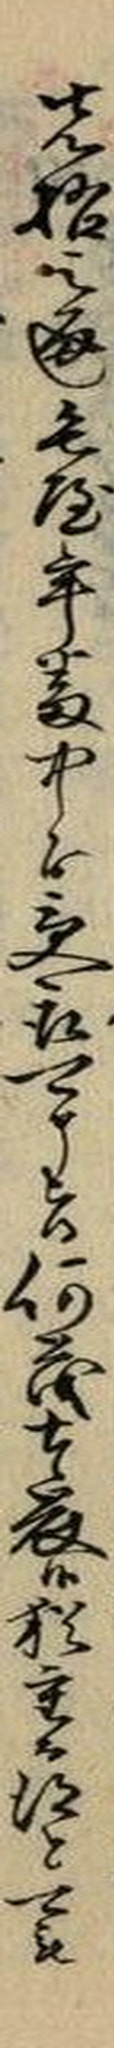先格之通毛屋年番中ゟ受取可申旨何も奉畏候猶重て得と可被
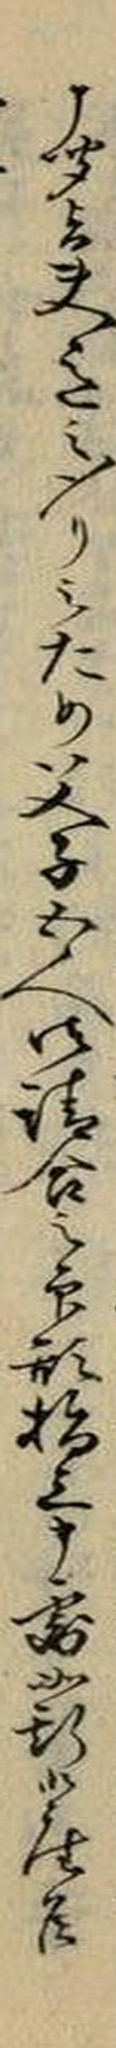申聞旨夫迄之〆り之ため父子五人御請合之印形指上申処如斯御座候
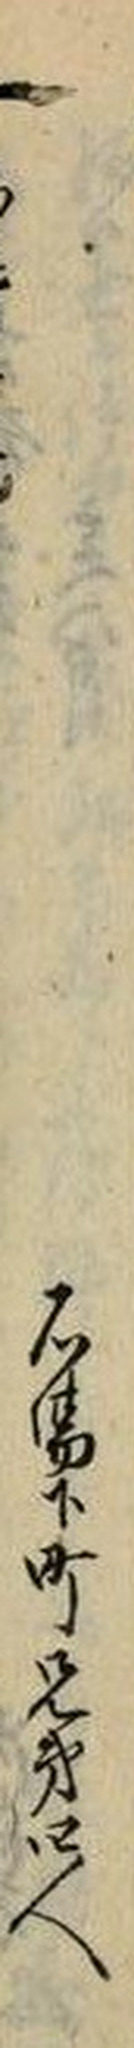石場下町兄弟四人
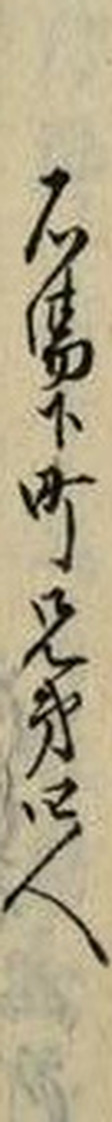石場下町兄弟四人
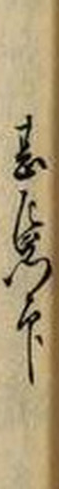平左衛門印
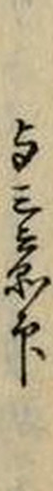与三兵衛印
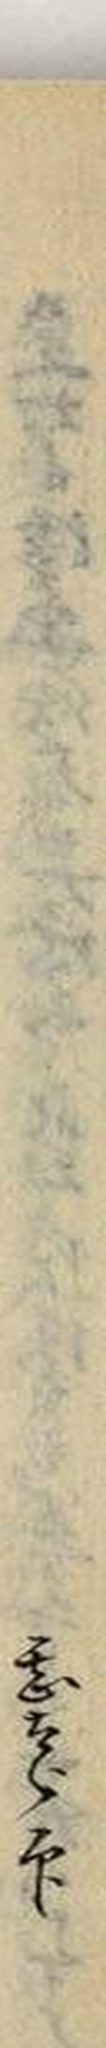甚太郎印
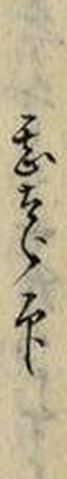甚太郎印
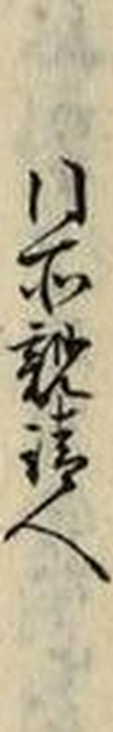同所親請人
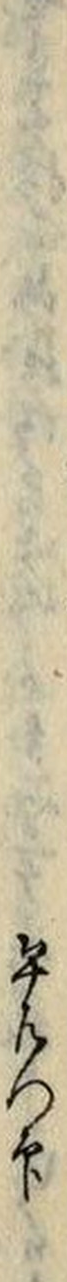平左衛門印
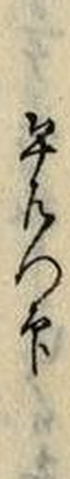平左衛門印
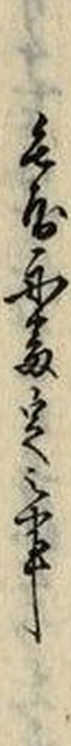毛屋舟番定之事
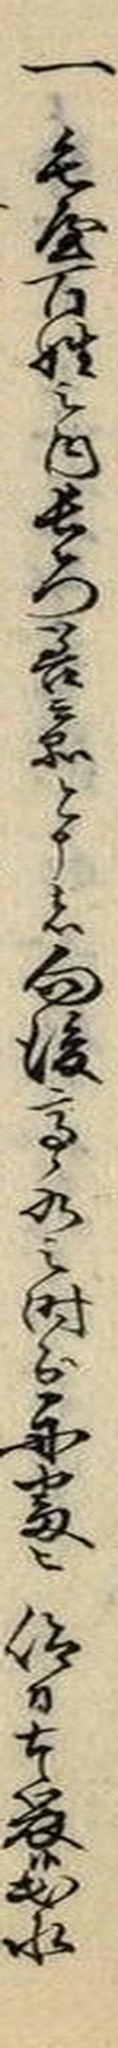一毛屋百姓之内長右衛門善兵衛と申者向後高水之時分舟番被仰付奉畏候出水
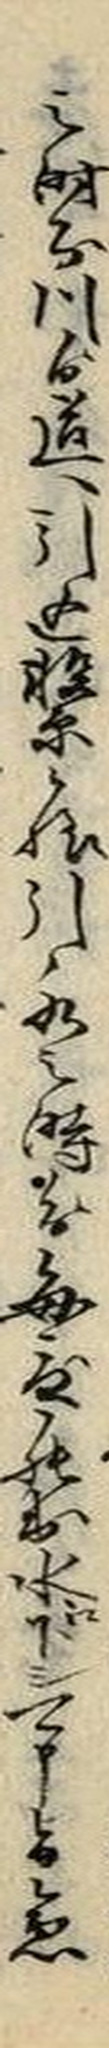之時分川ゟ道へ引込繋候様引水之時分毎度罷出水え下シ可申旨急
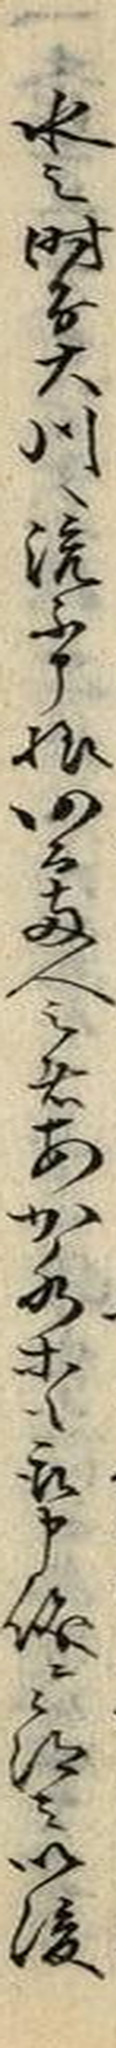水之時分大川へ流不申様仍て両人之者あか水等も取申儀に候得は以後
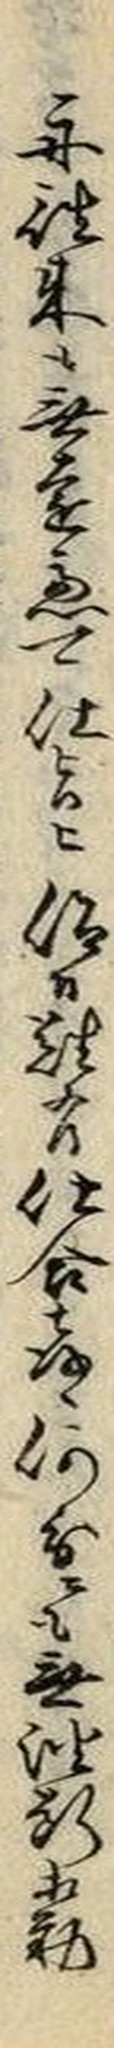舟往来も無遠慮可仕旨被仰付難有仕合奉存候何分にも無油断相勤
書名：御城下諸事之部
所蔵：福井県文書館 Fukui Prefectural Archives
